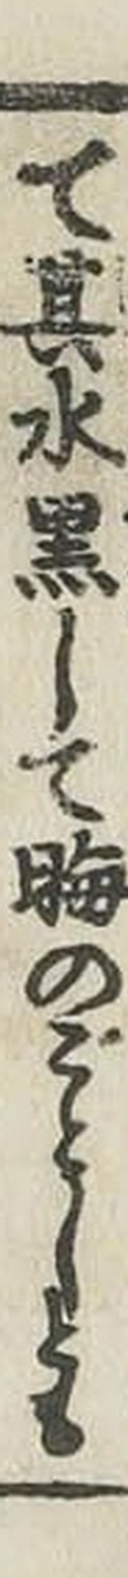て其水黒して晦のごとしとも
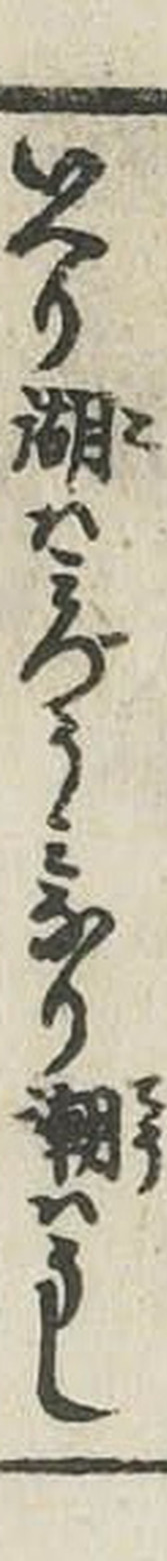いへり湖はみづうみなり潮はうし
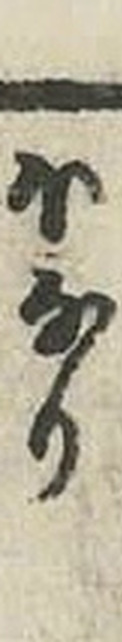ほなり
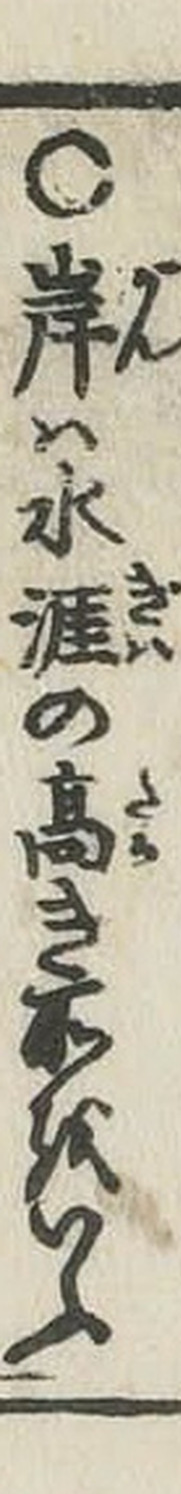○岸は水涯の高き所をいふ
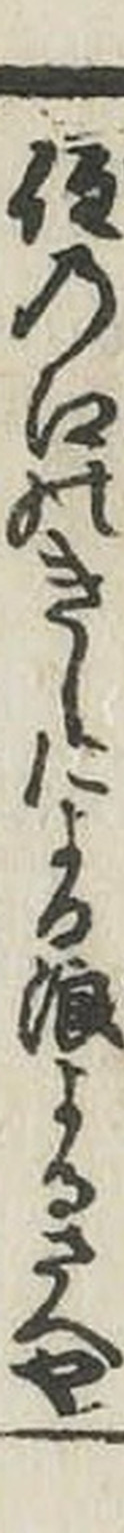住の江のきしによる浪よるさへや
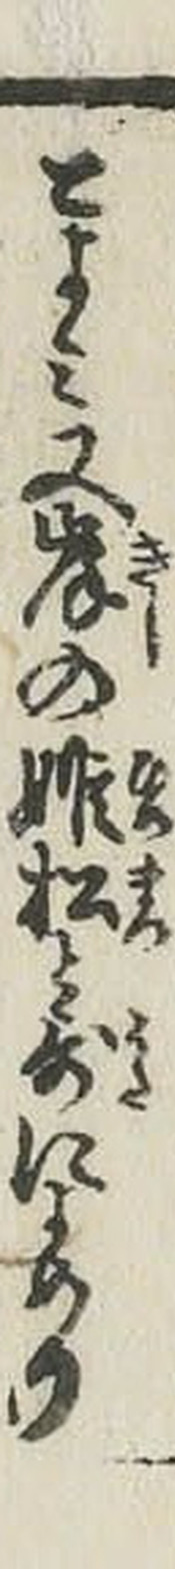とよみ又岸の姫松と哥によめり
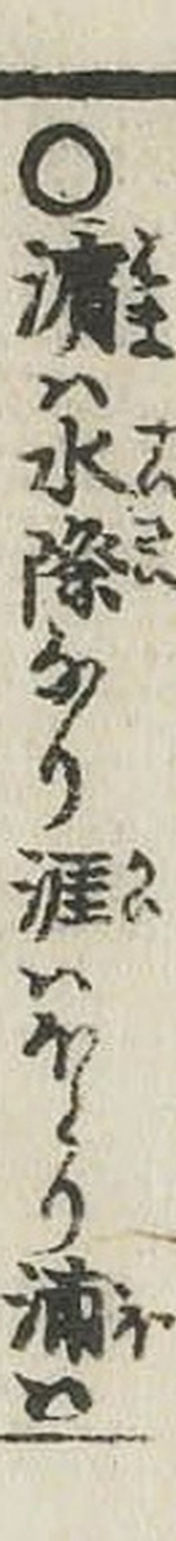○浜は水際なり涯はほとり浦は
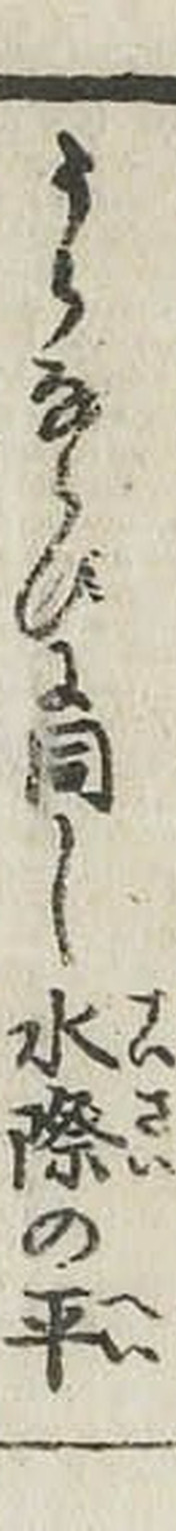うらならひに同し水際の平
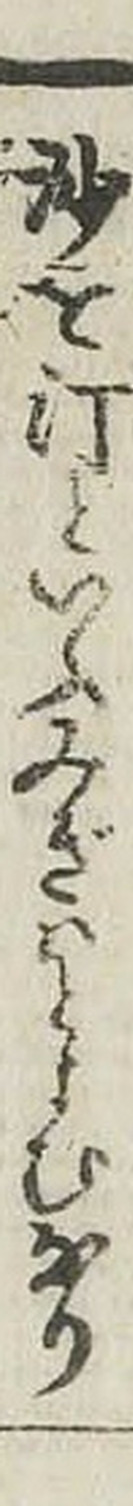沙を汀といふみぎはとよむなり
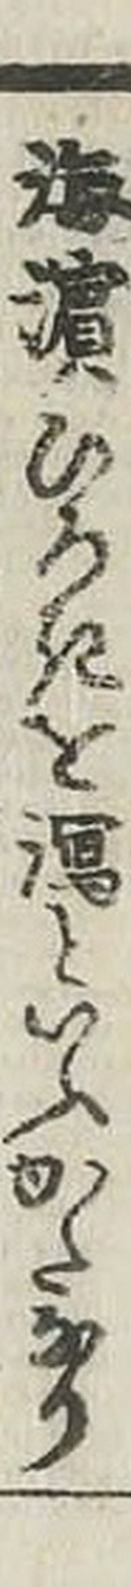海浜ひろきを瀉といふかたなり
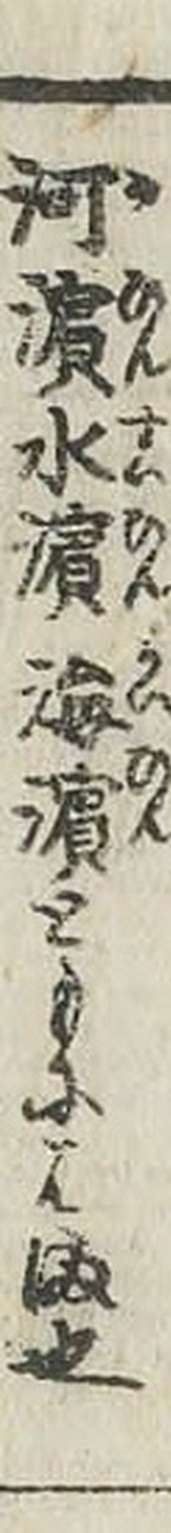河浜水浜海浜ともにはま也
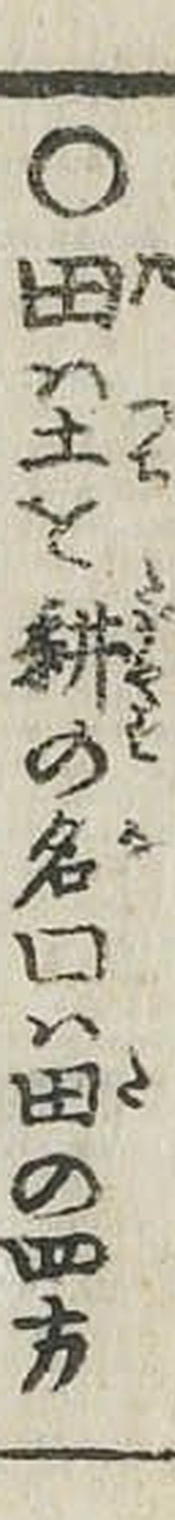○田は土を耕の名囗は田の四方
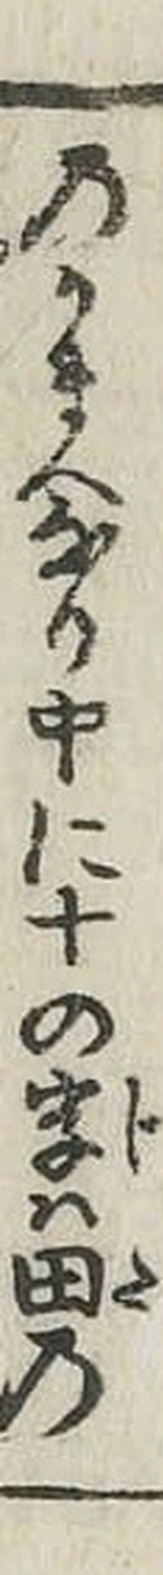のかまへなり中に十の字は田の
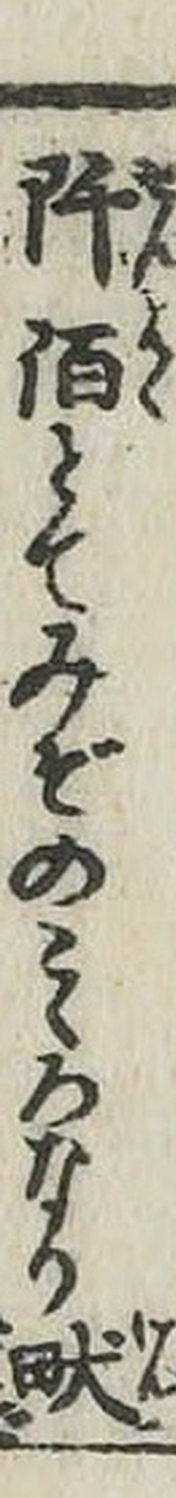阡陌とてみぞのこゝろなり畎

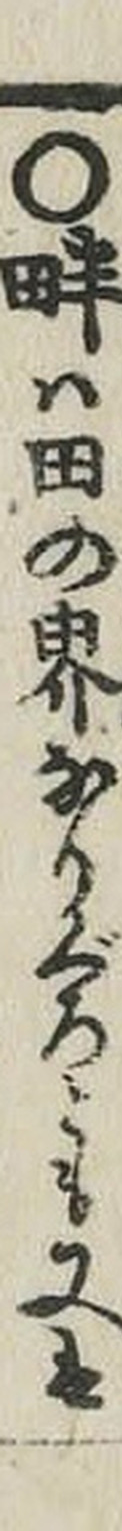○畔は田の界なりぐろとも又は
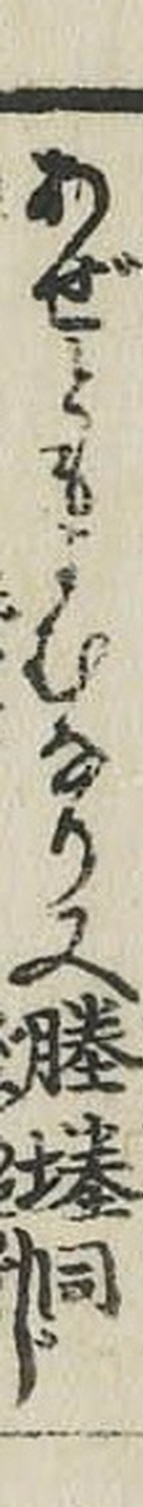あぜともよむなり又塍堘同じ
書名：増補頭書訓蒙図彙大成 10巻 2:巻之1-3
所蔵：東京学芸大学教育コンテンツアーカイブ
